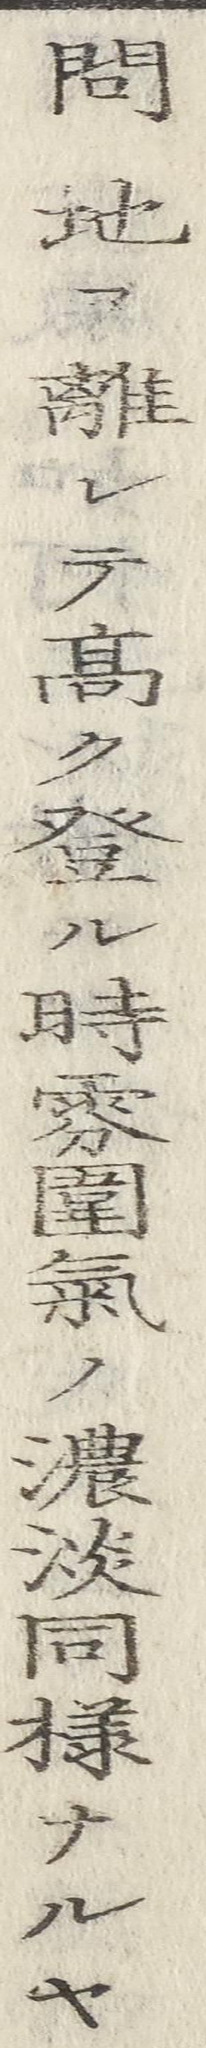問地ヲ離レテ高ク登ル時雰囲気ノ濃淡同様ナルヤ
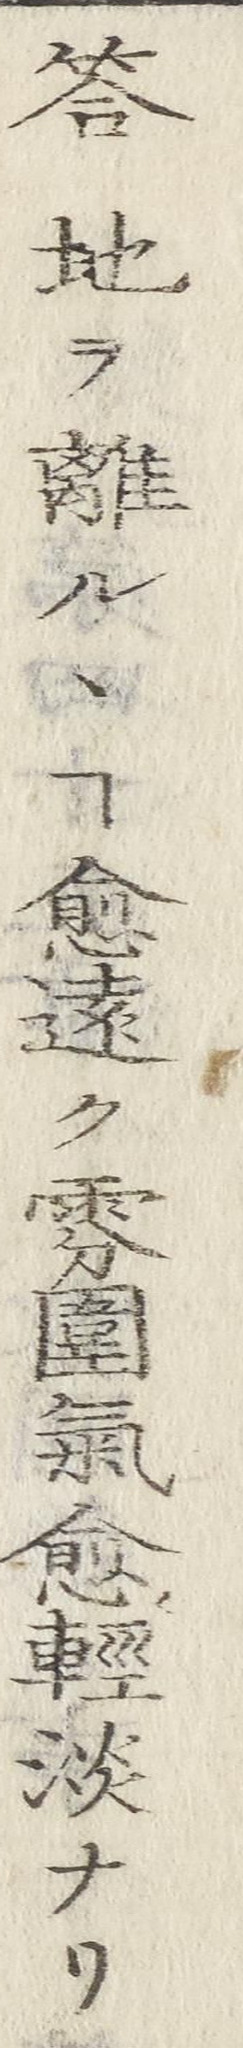答地ヲ離ルヽコト愈遠ク雰囲気愈軽淡ナリ
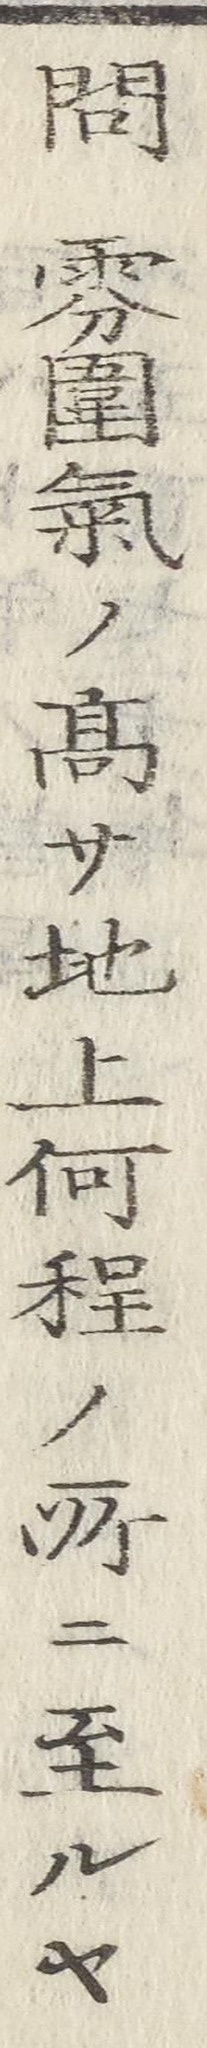問雰囲気ノ高サ地上何程ノ所ニ至ルヤ
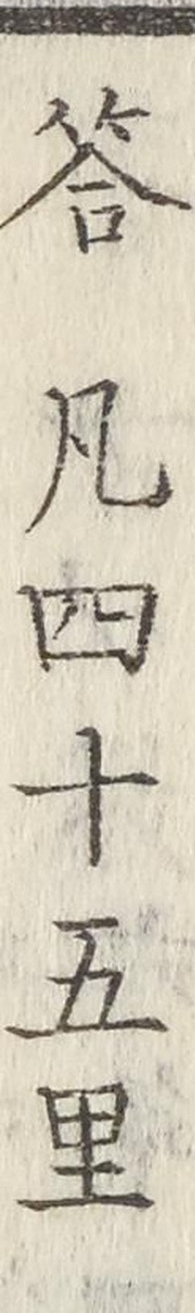答凡四十五里
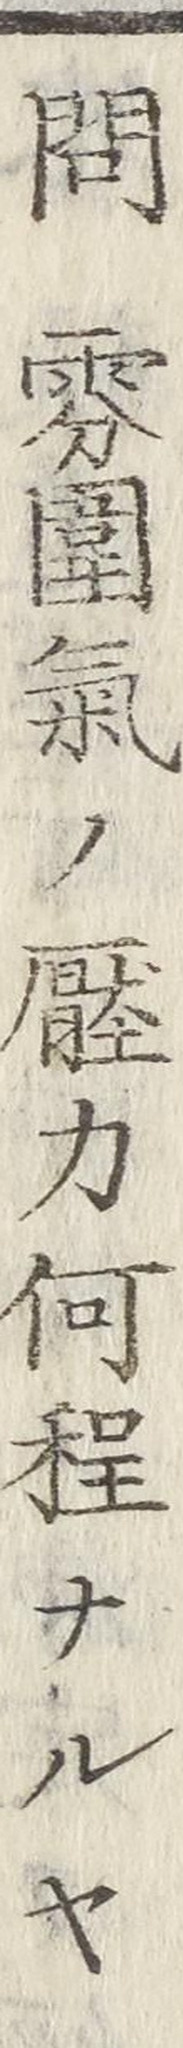問雰囲気ノ圧力何程ナルヤ
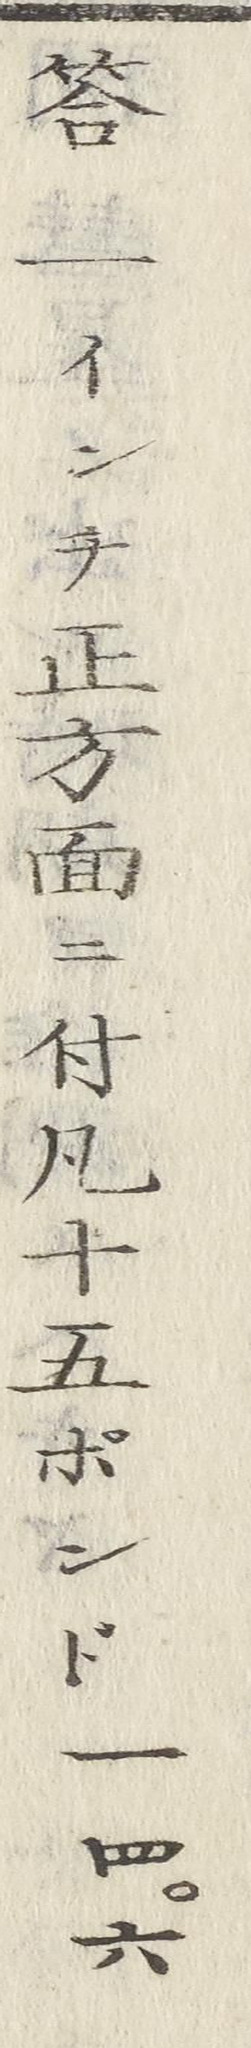答一インチ正方面ニ付凡十五ポンド十四。六
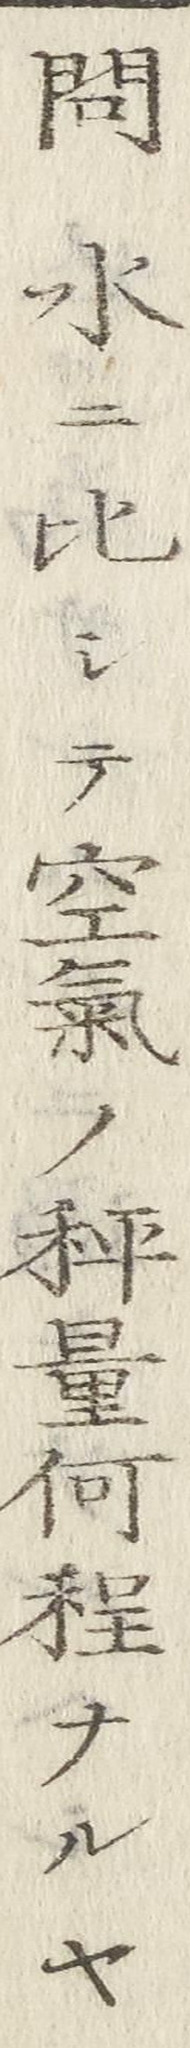問水ニ比シテ空気ノ秤量何程ナルヤ
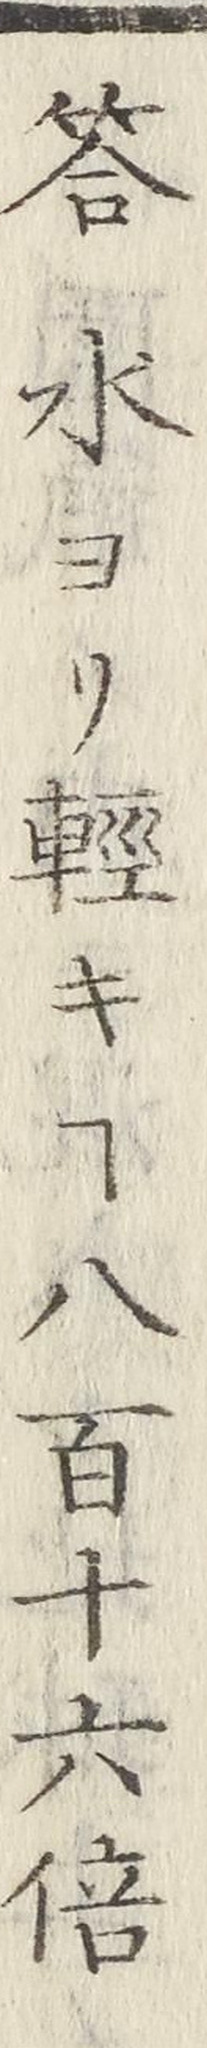答水ヨリ軽キコト八百十六倍
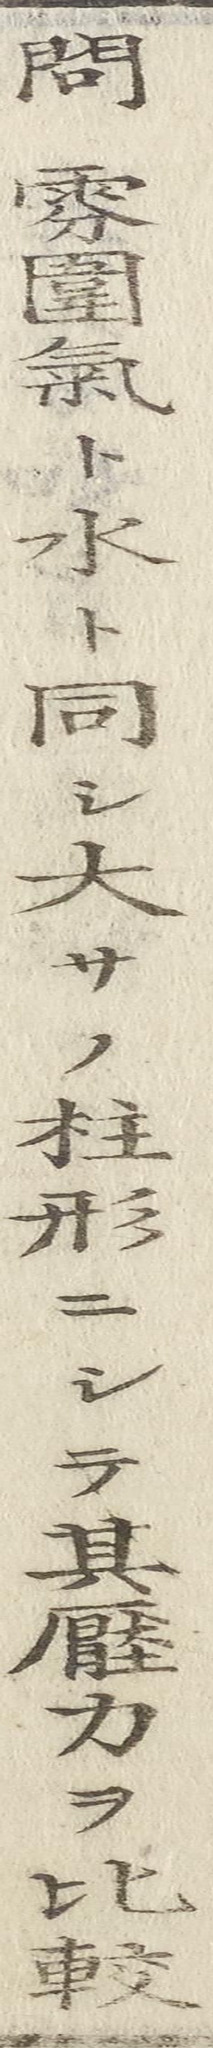問雰囲気ト水ト同シ大サノ柱形ニシテ其圧力ヲ比較
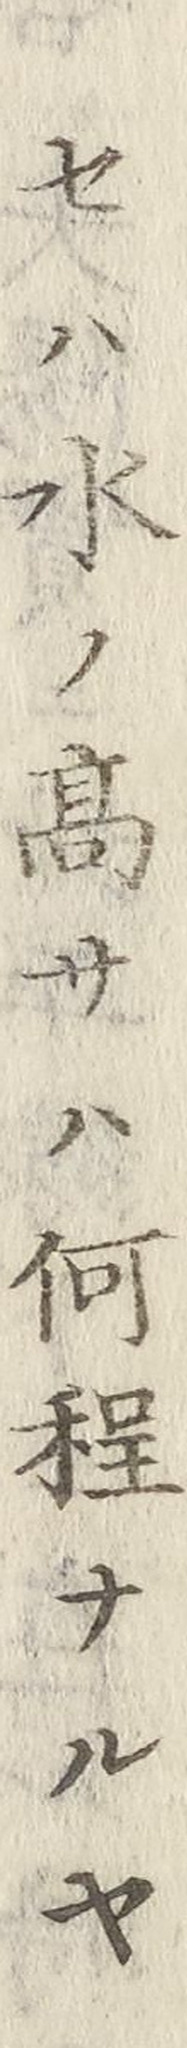セハ水ノ高サハ何程ナルヤ
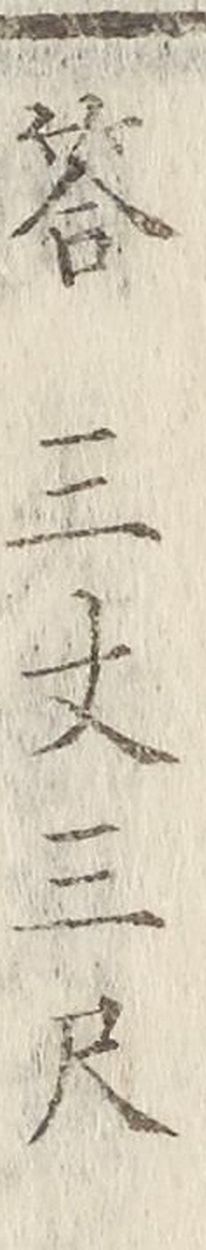答三丈三尺
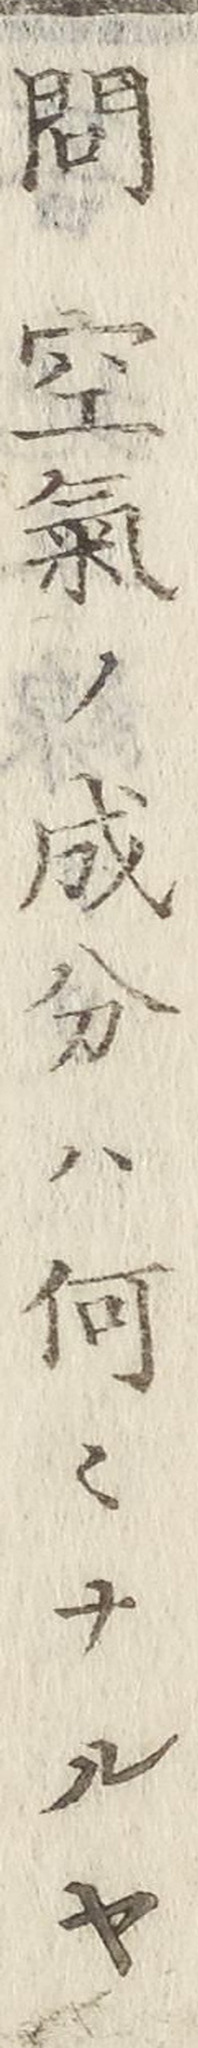問空気ノ成分ハ何〻ナルヤ
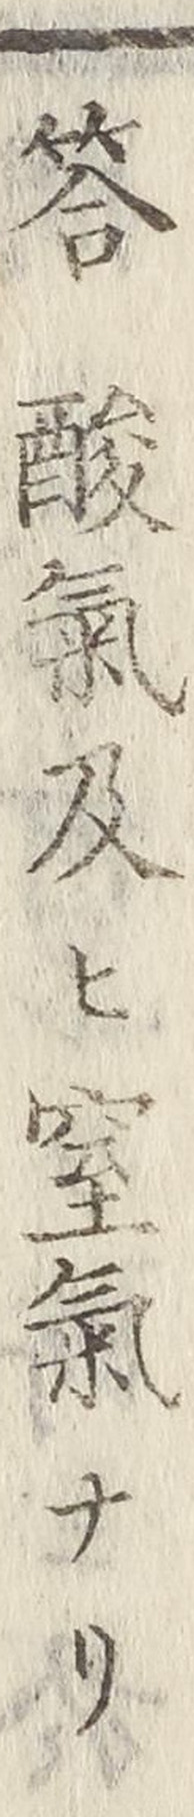答酸気及ヒ空気ナリ
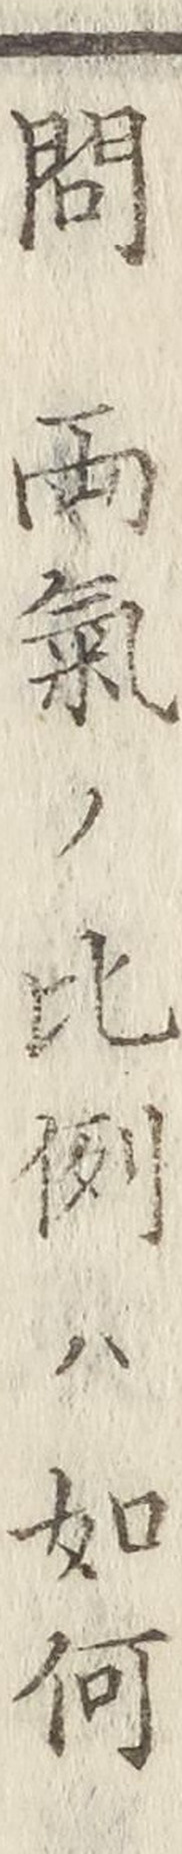問両気ノ比例ハ如何
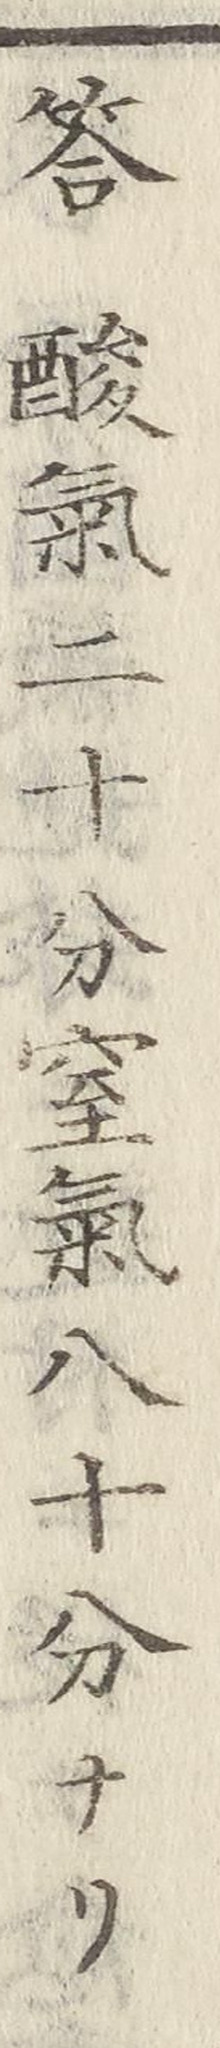答酸気二十分空気八十分ナリ
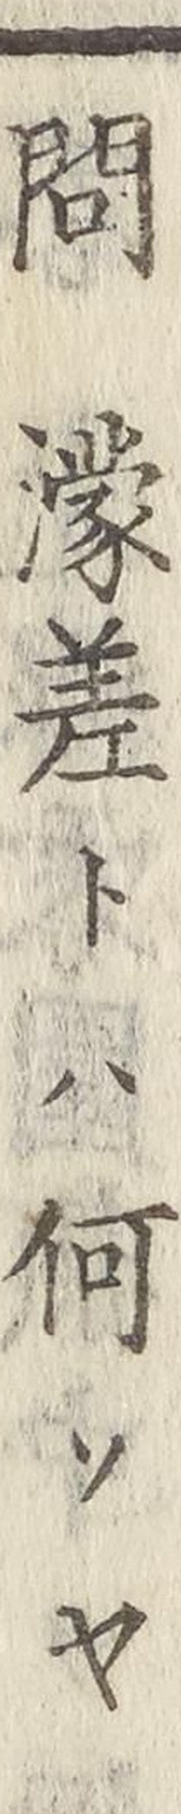問濛差トハ何ソ
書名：星学圖説　下
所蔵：東京大学地震研究所図書室 Earthquake Research Institute Library, The University of Tokyo, JAPAN
